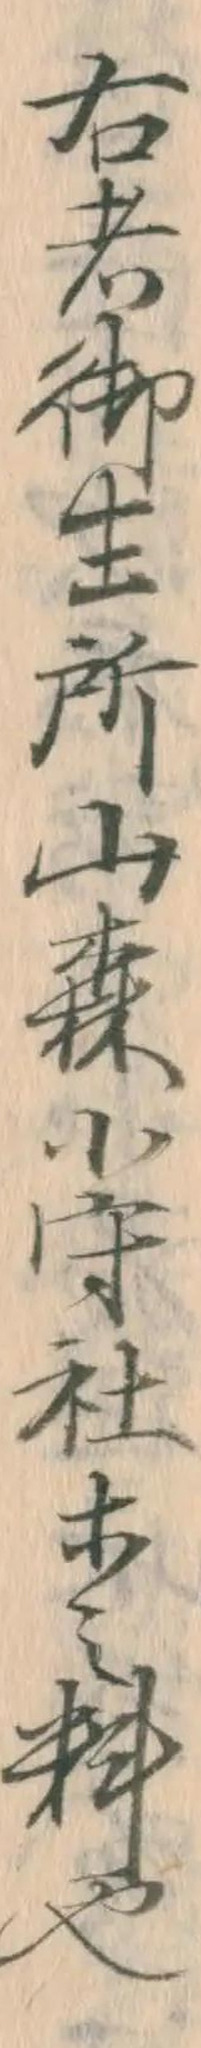右は御生所山森小守社等之料也
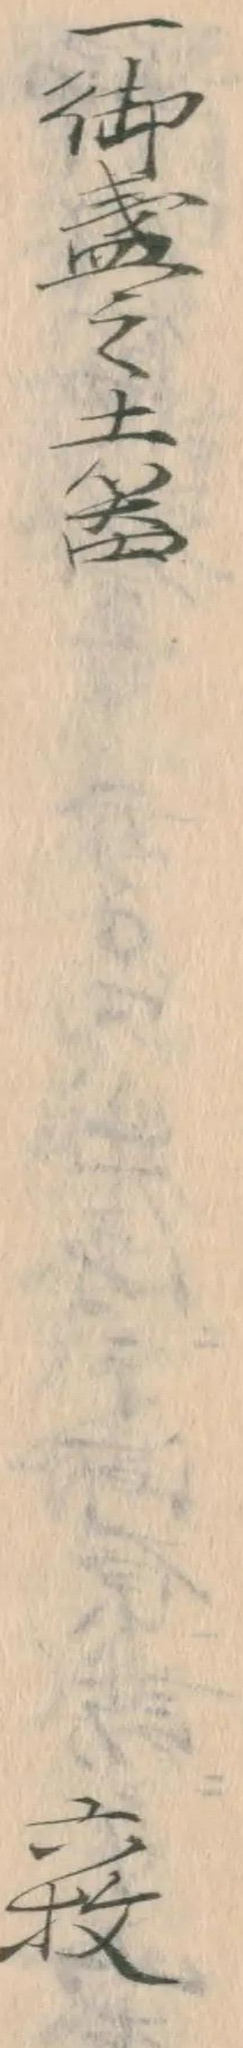一御盞之土器六枚
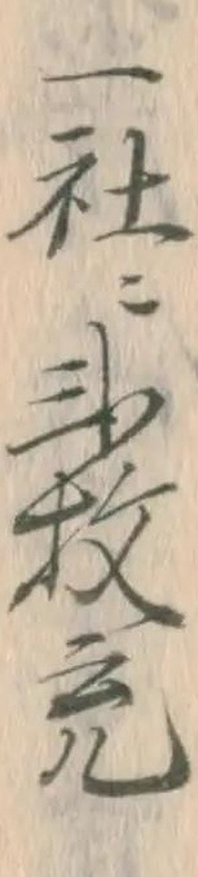一社ニ弐枚宛
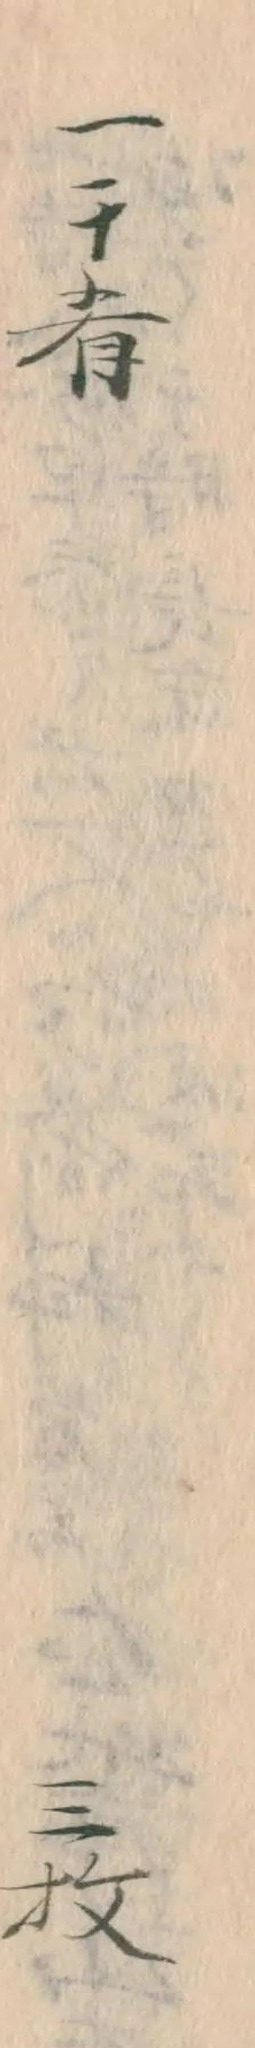一干肴三枚
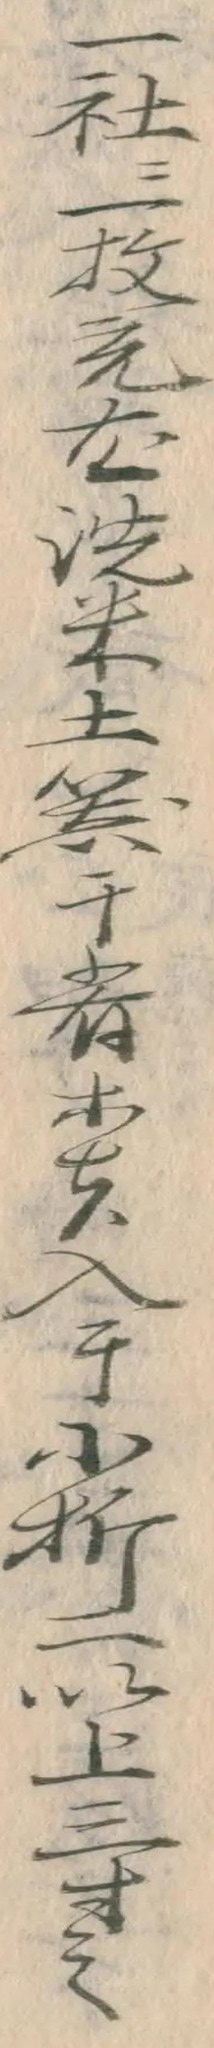一社ニ一枚宛尤洗米土器干肴等は入于小折二以上三寸之

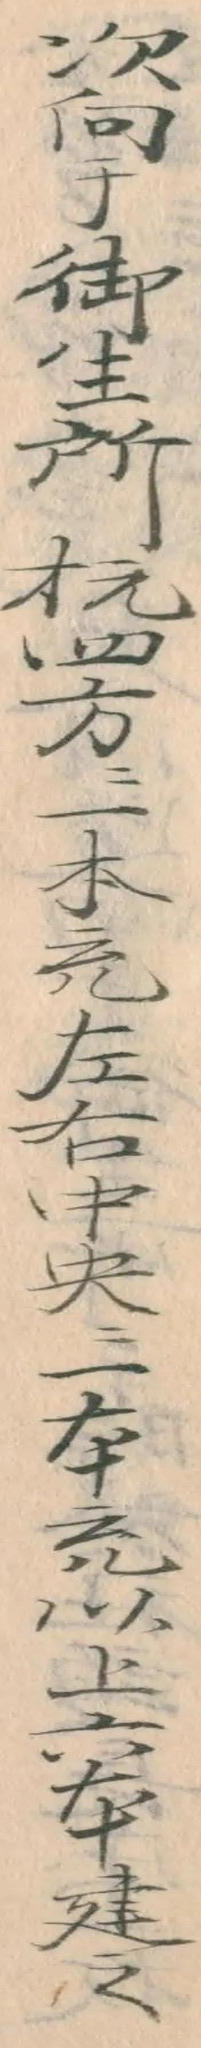次向于御生所杭四方ニ一本充左右中央ニ一本充以上六本建之
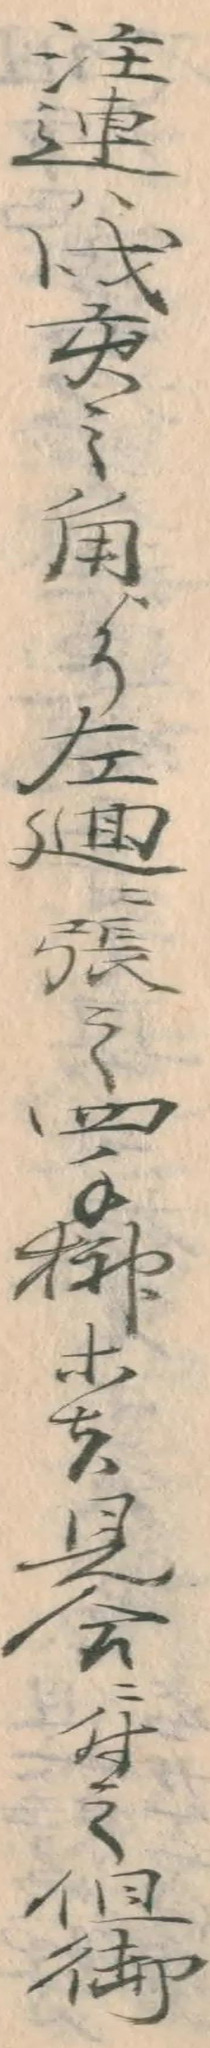注連ハ戌亥之角より左廻ニ張也四手榊等は見合ニ付之但御
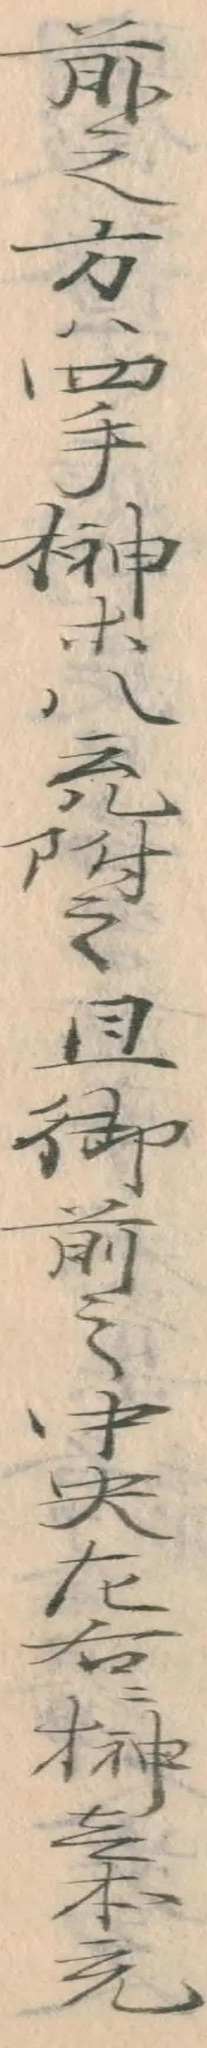前之方ハ四手榊等八充附之且御前之中央左右ニ榊壱本充
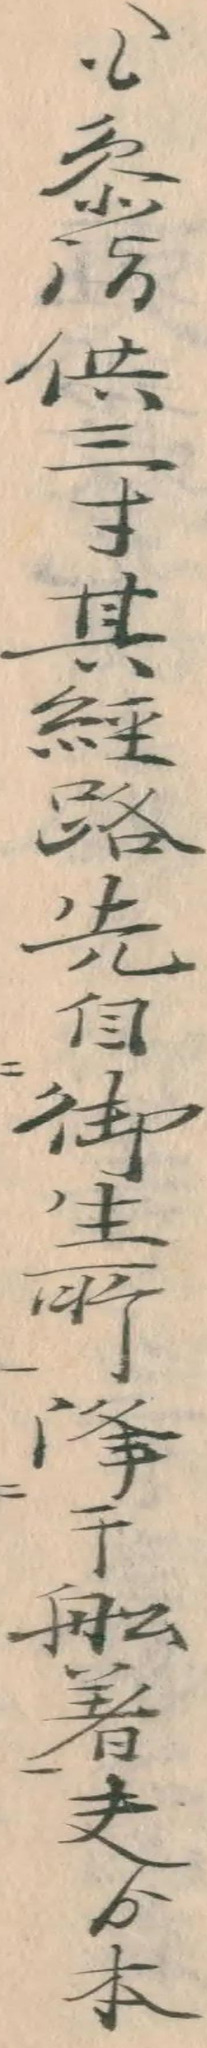へも参詣供三寸其経路先自御生所降于舩着夫ゟ本
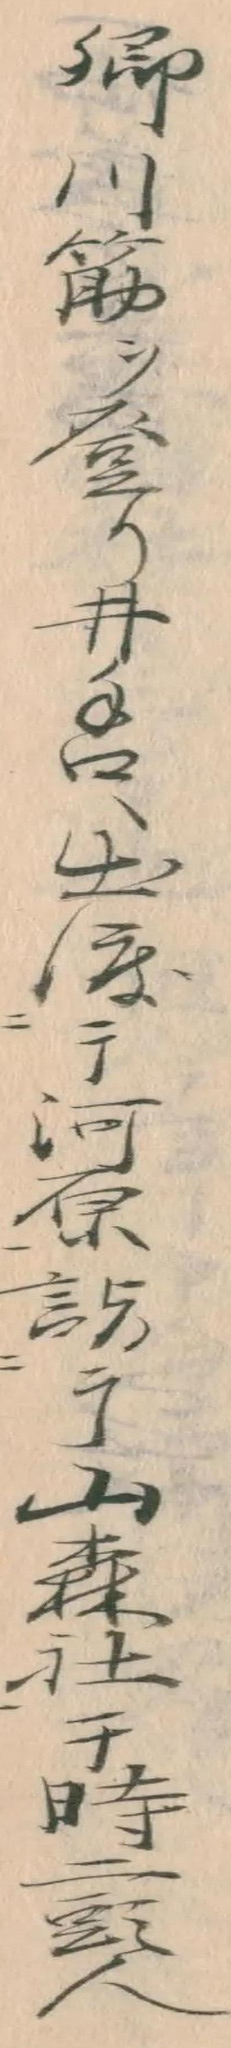郷川筋ヲ登り井手口へ出渡于河原詣于山森社于時二頭人
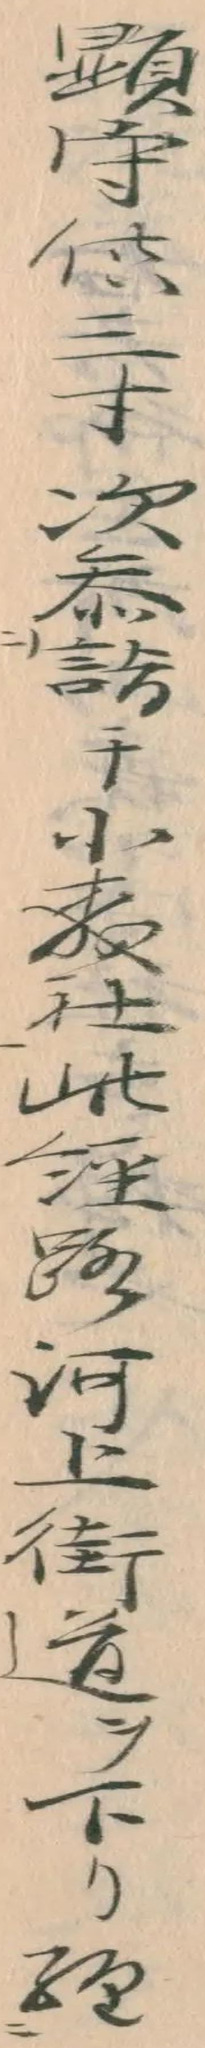顕守供三寸次参詣于小森社此経路河上街道ヲ下リ経
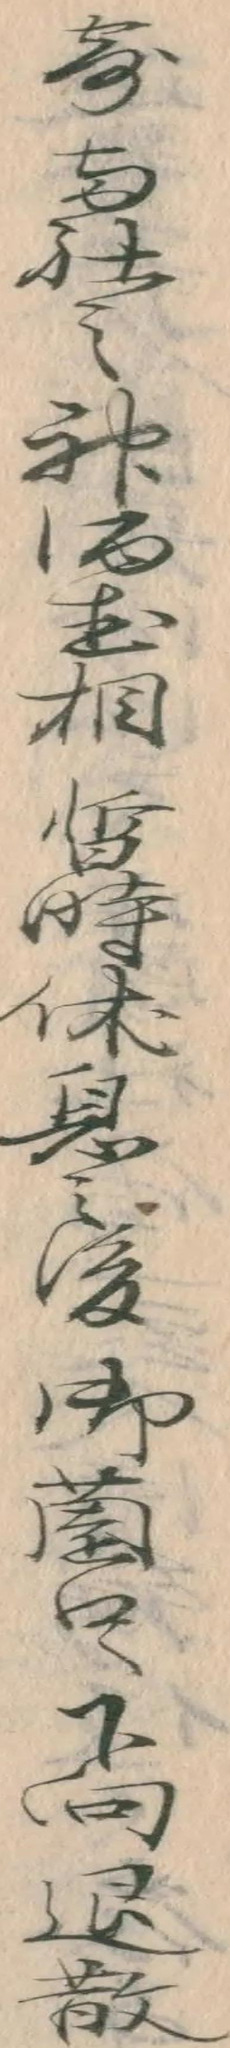寄両社之神酒直相暫時休息之後御薗口へ下向退散
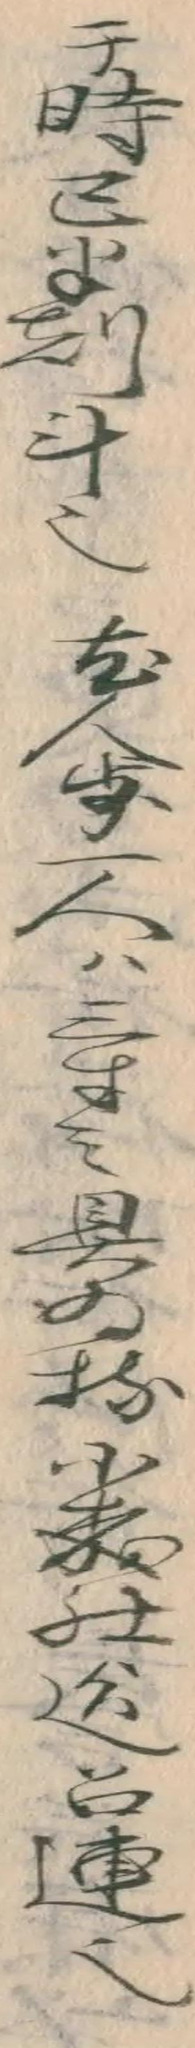于時巳半刻斗也尤人歩一人ハ三寸之具為持小森社迄召連也
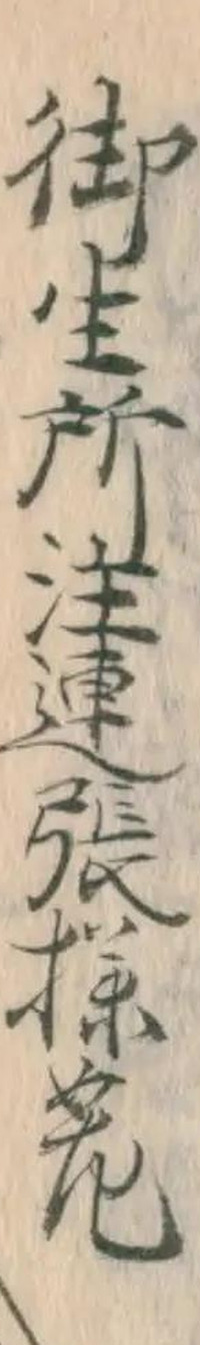御生所注連張様如件
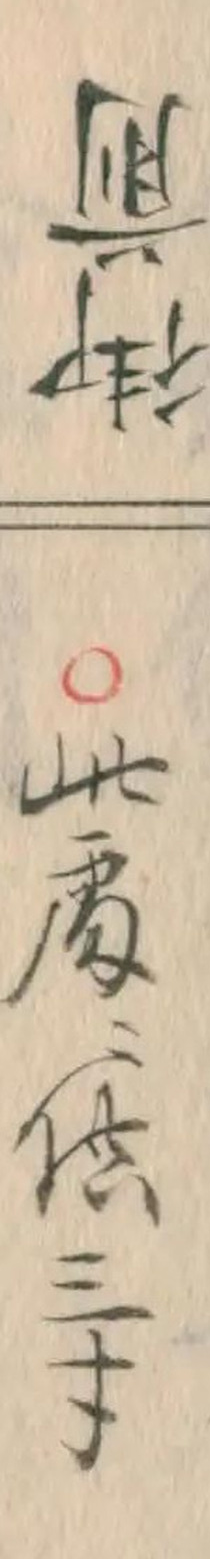○此處に供三寸
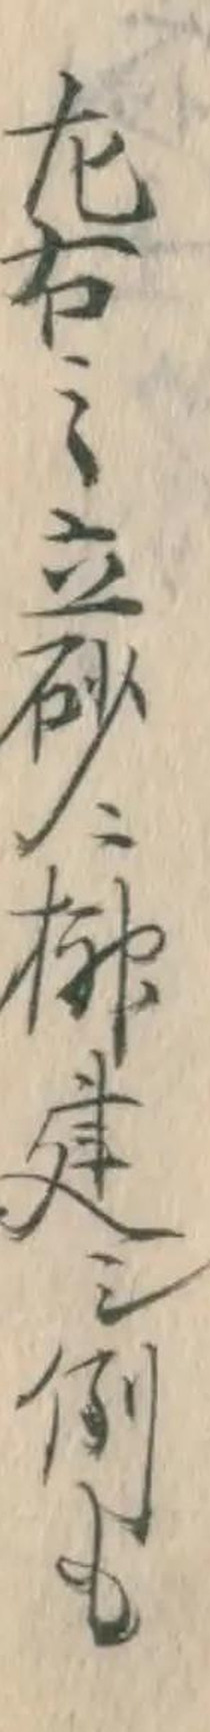左右之立砂ニ榊建シ例も
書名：賀茂社記録. 第73冊
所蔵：国立国会図書館 National Diet Library, JAPAN
